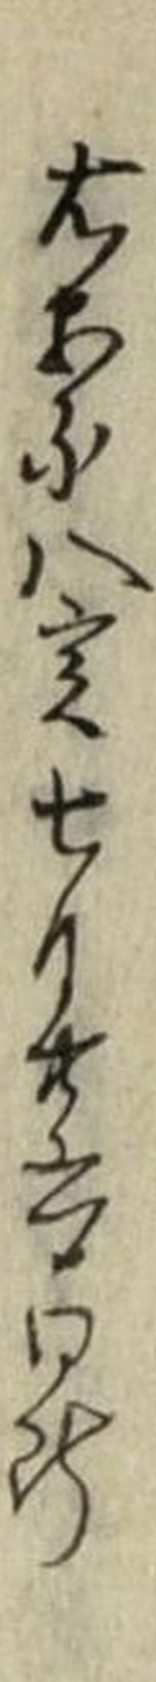右安永八亥七月廿六日同断
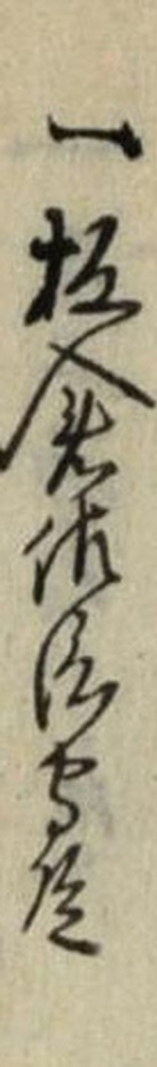一板倉佐渡守殿
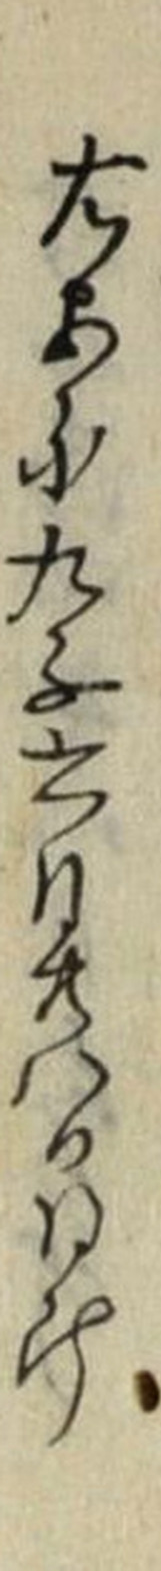右安永九子六月廿八日同断
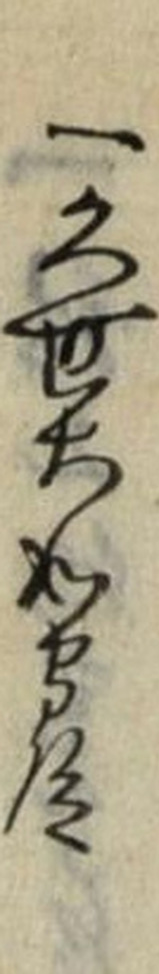一久世大和守殿
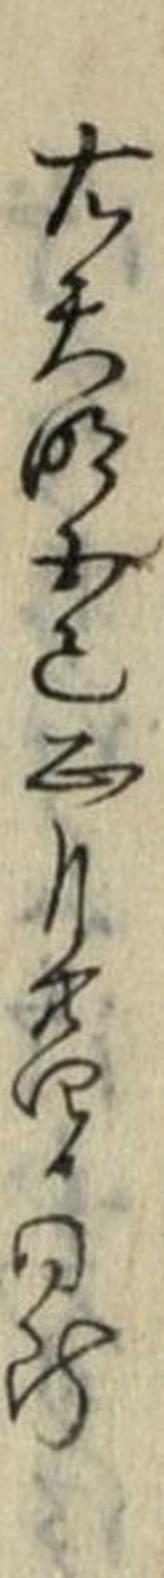右天明五巳正月廿四日同断
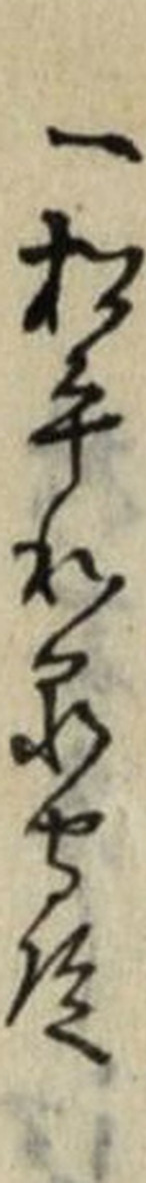一松平和泉守殿
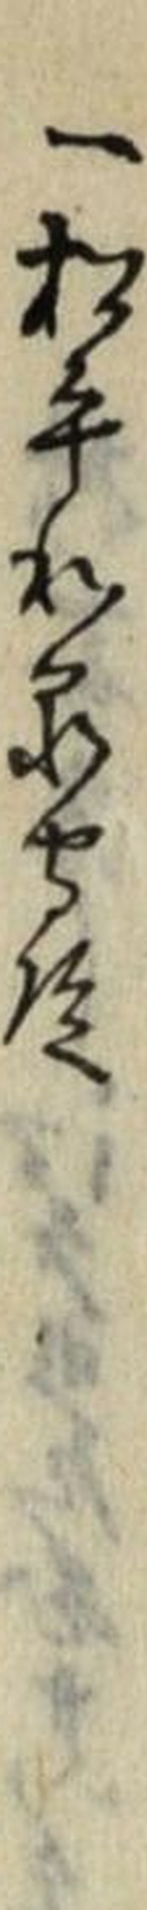一松平和泉守殿
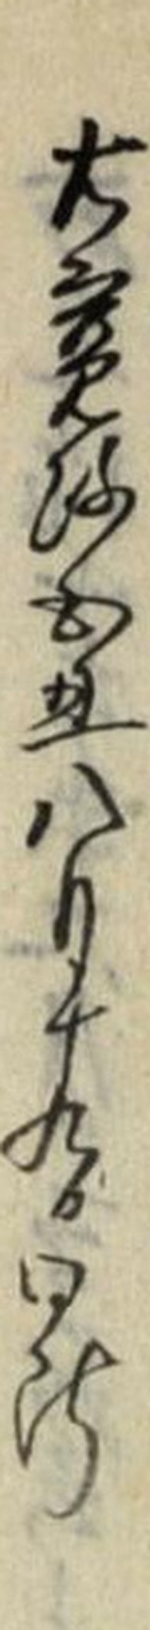右寛政五丑八月十九日同断
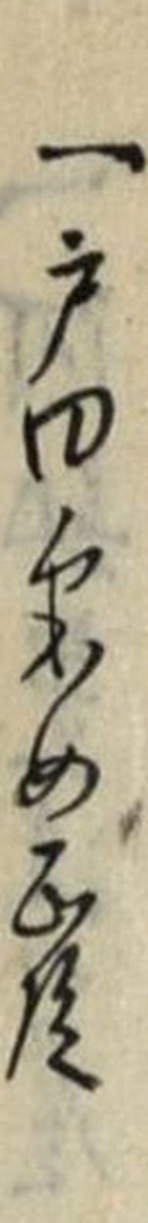一戸田采女正殿
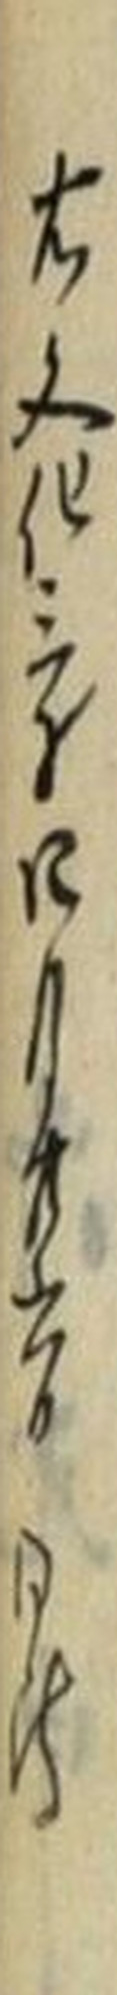右文化三刁四月廿六日同断
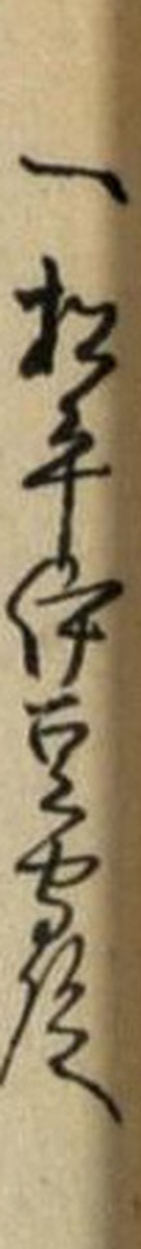一松平伊豆守殿
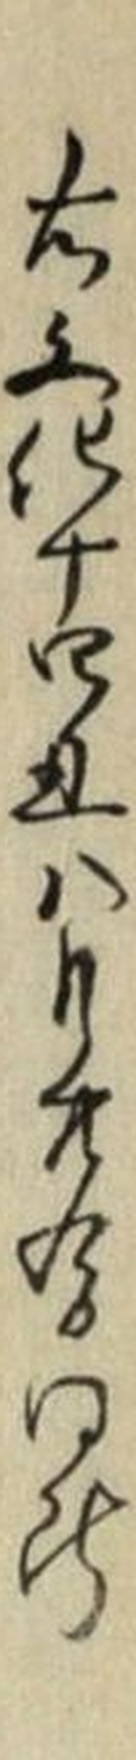右文化十四丑八月廿九日同断
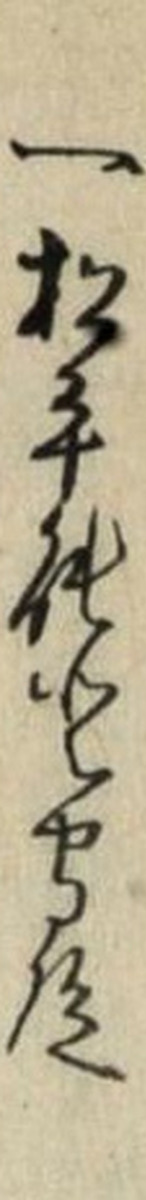一松平能登守殿
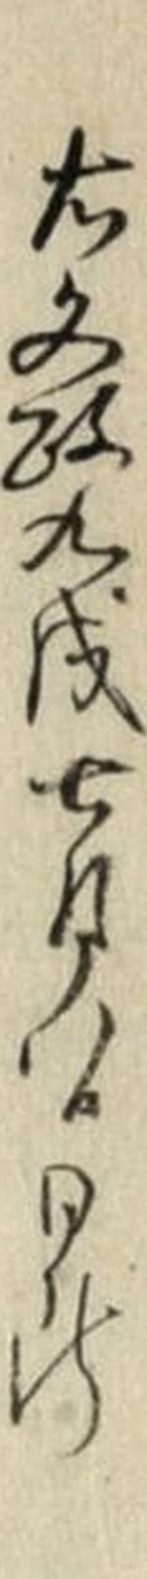右文政九戌七月八日同断
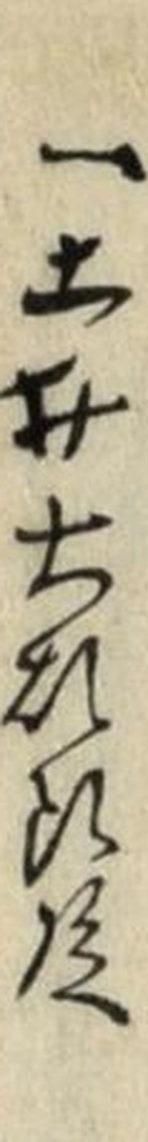一土井大炊頭殿
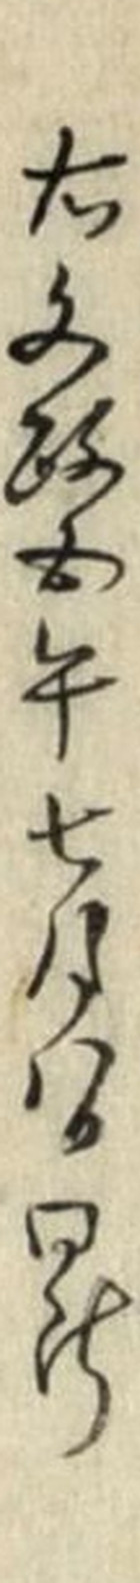右文政五午七月八日同断
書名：御停止異変死失
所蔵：福井県文書館 Fukui Prefectural Archives
